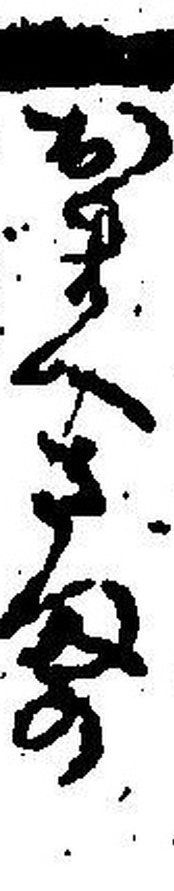おまへさまの
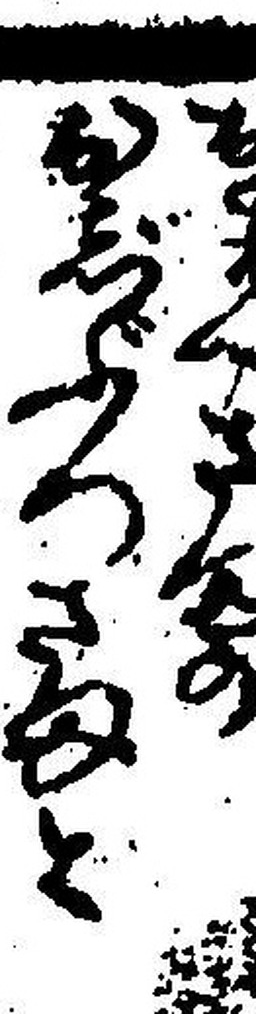おじぶつさまと
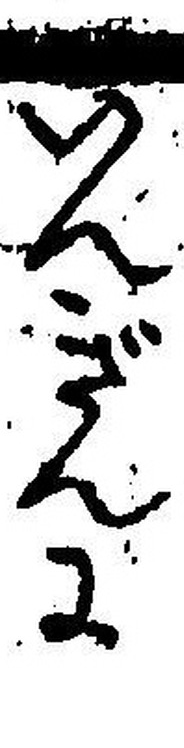いんぎんに

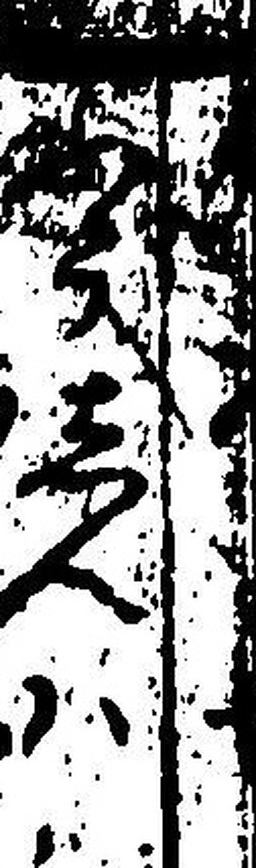ふうしんは
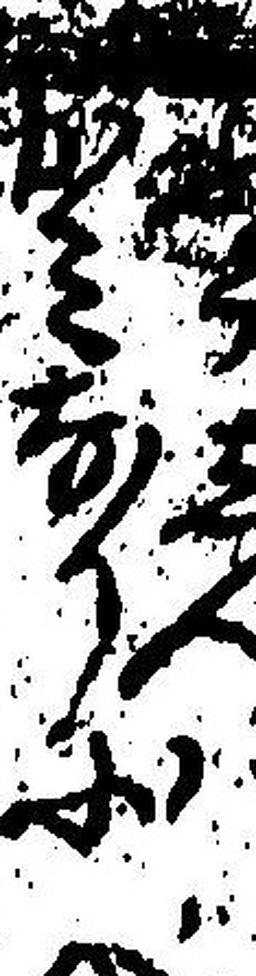かみなりに
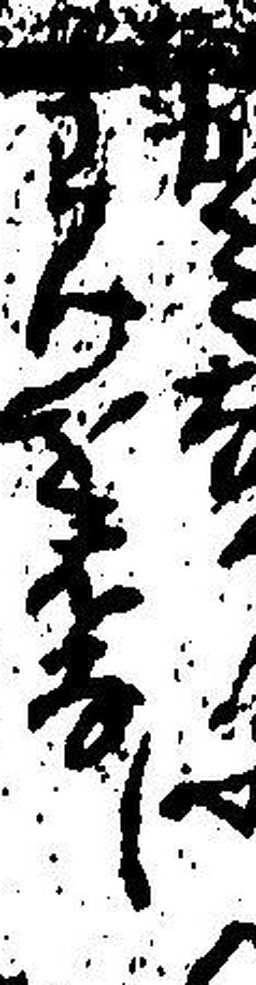わけをはなし
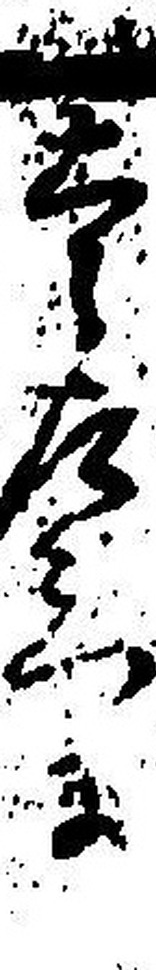太郎左衛門に
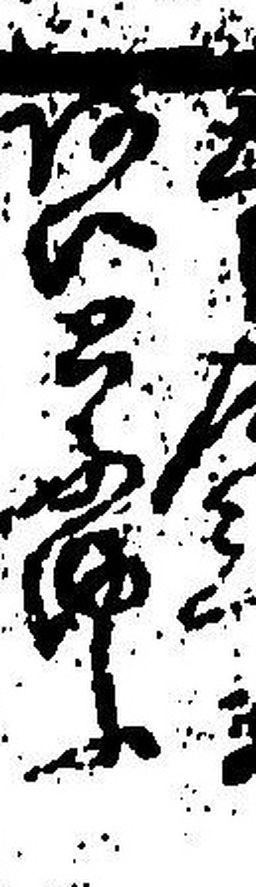あいとふゆふ
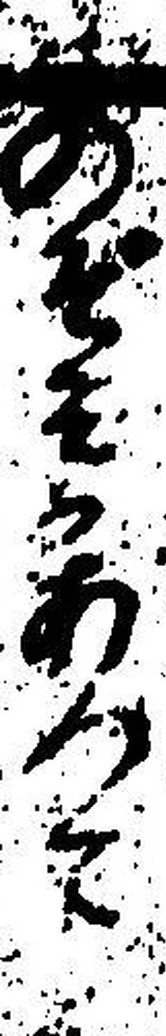のぞみかあつて
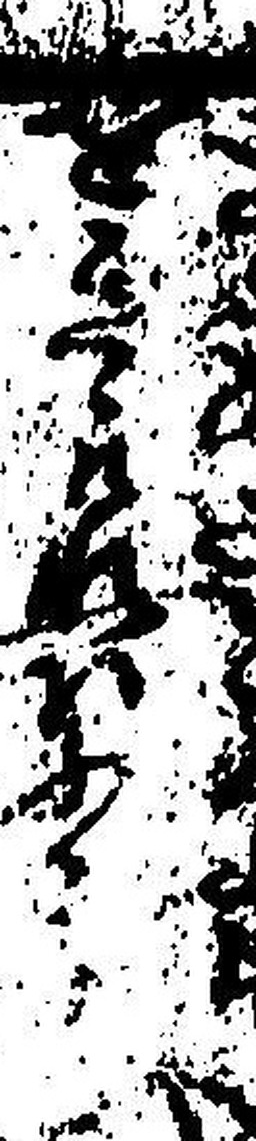をきゝけれはふう
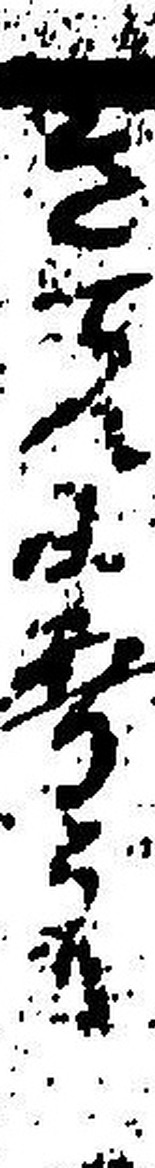きてんにありとも
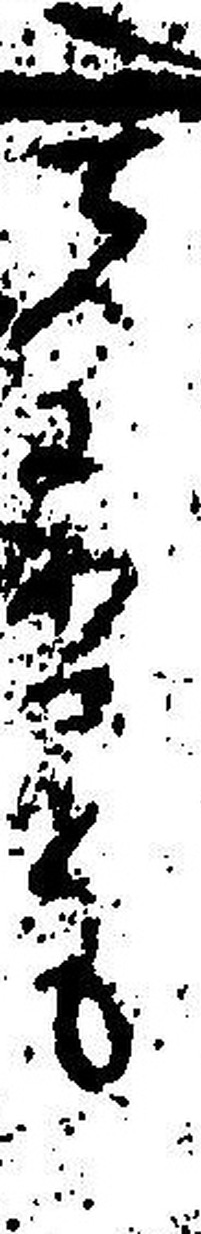てんにあるとも
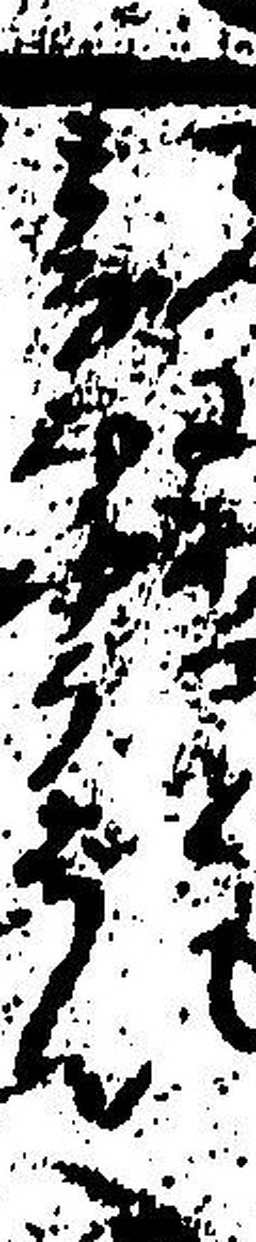みなひやうばん
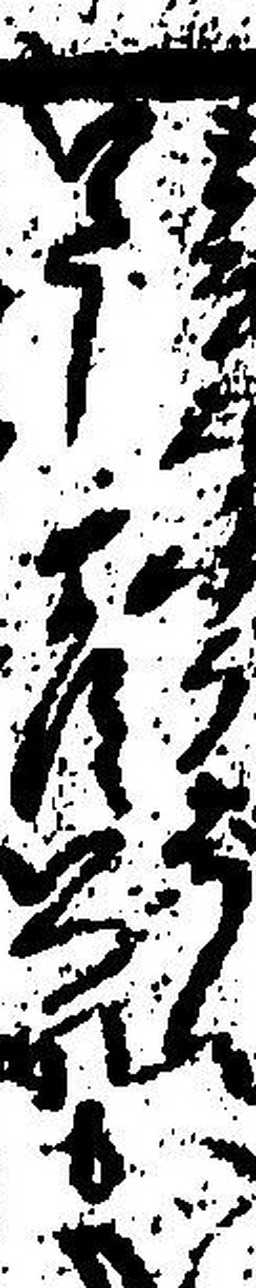いたしますいづれも
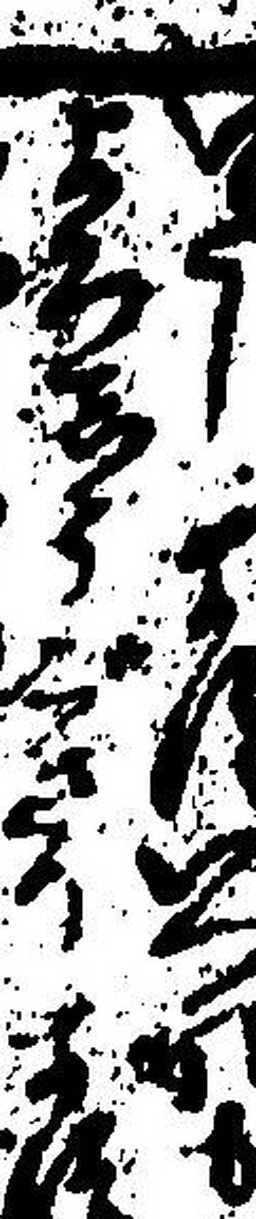よろしうごさります
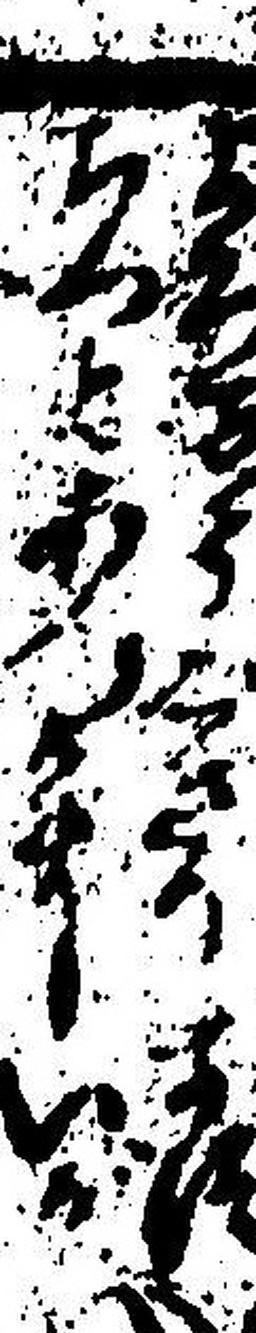ちつとあつかましいが
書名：牡丹餅棚有 / 市場通笑作
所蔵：東京大学総合図書館 General Library in the University of Tokyo, JAPAN
